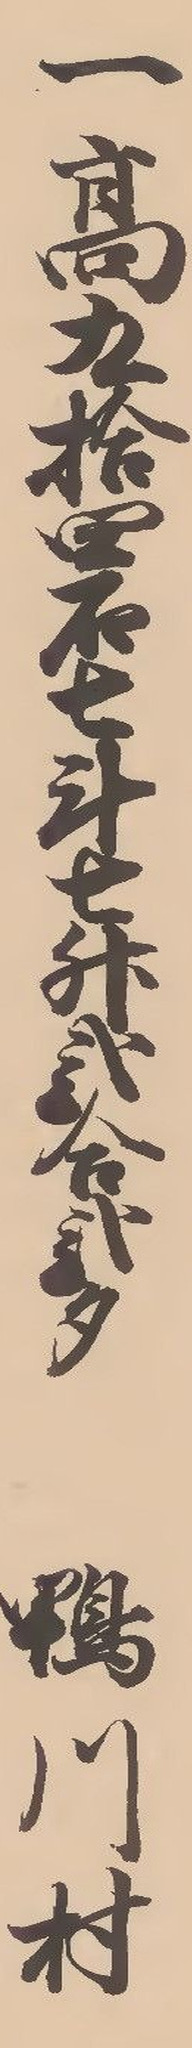一高九拾四石七斗七升弐合弐勺鴨川村
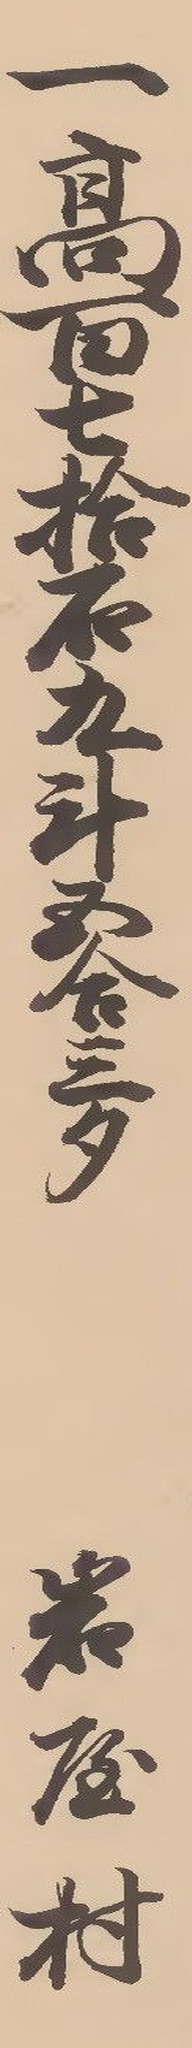一高百七拾石九斗五合三勺岩屋村
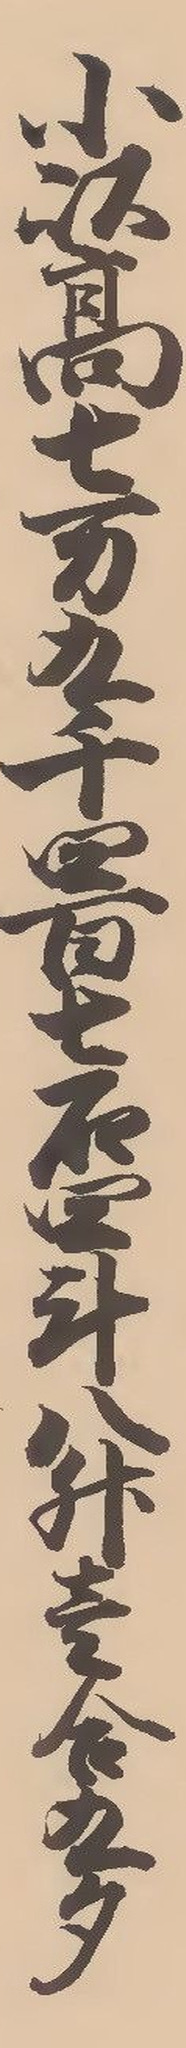小以高七万九千四百七石四斗八升壱合九勺

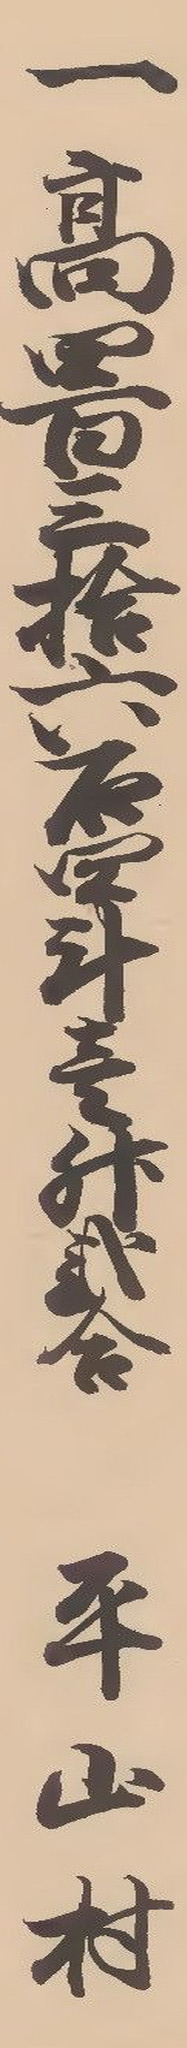一高四百三拾六石四斗壱升弐合平山村
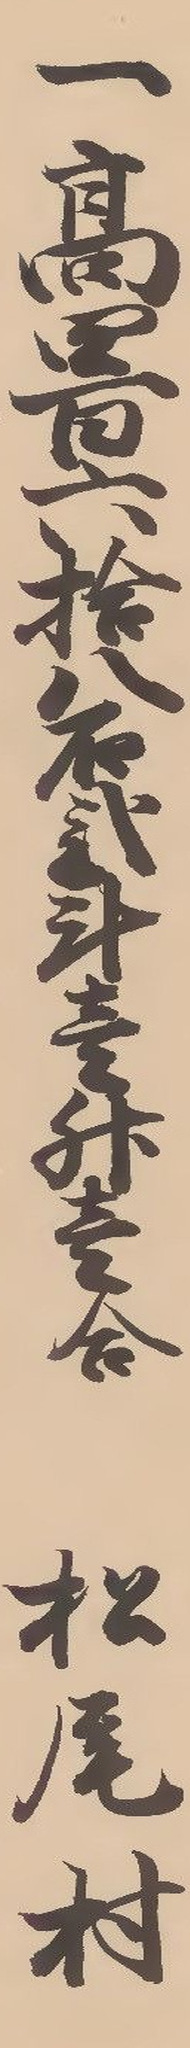一高四百六拾八石弐斗壱升壱合松尾村
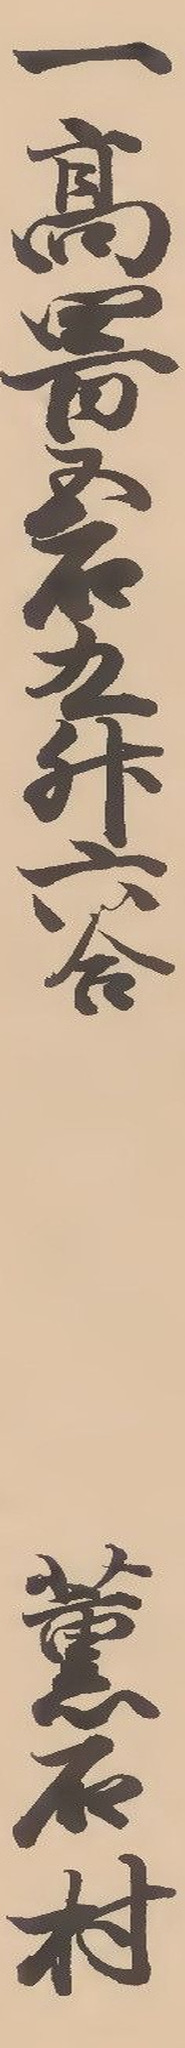一高四百五石九升六合薫石村
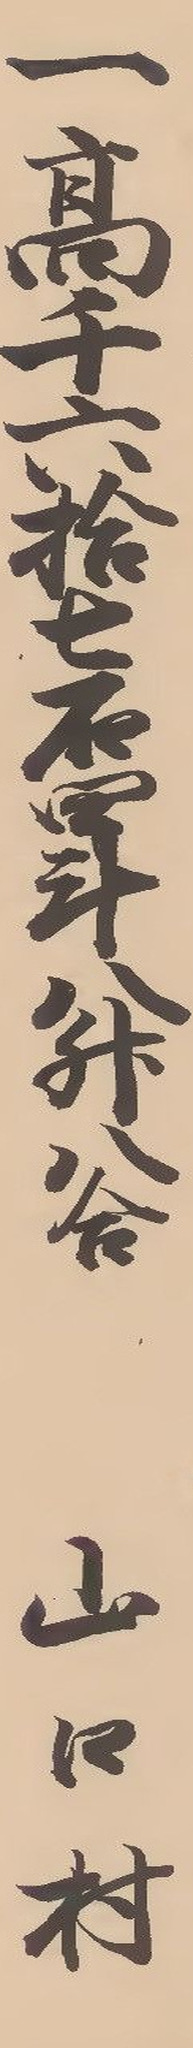一高千六拾七石四斗八升八合山口村
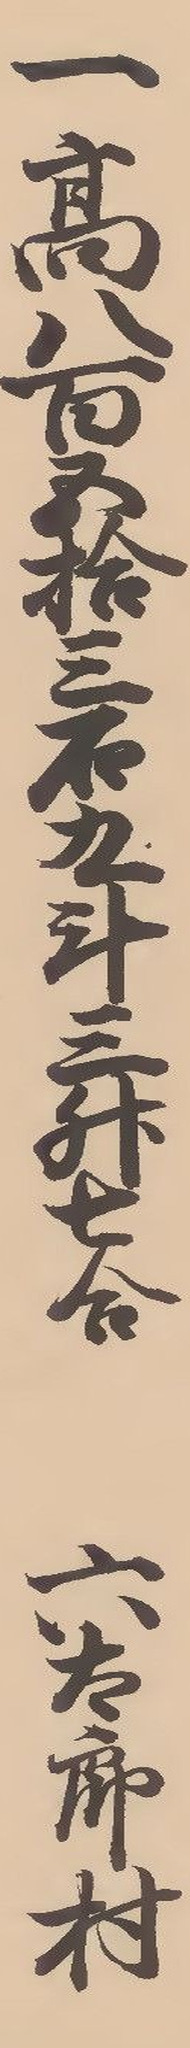一高八百五拾三石九斗三升七合六太郎村
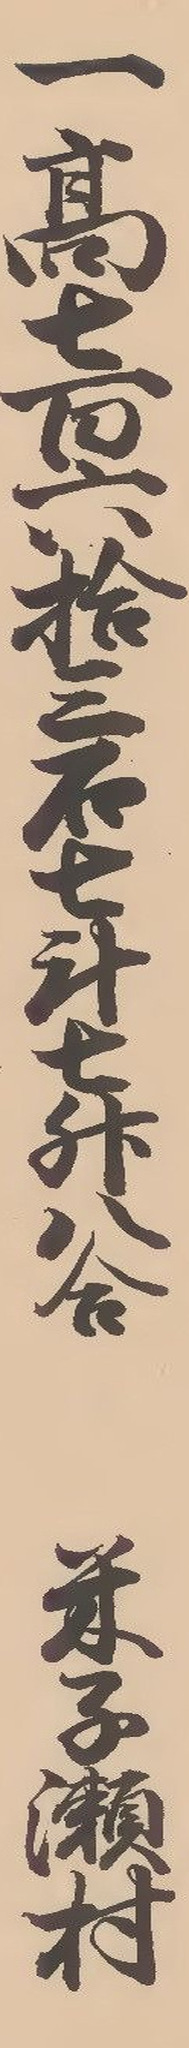一高七百六拾三石七斗七升八合米子瀬村

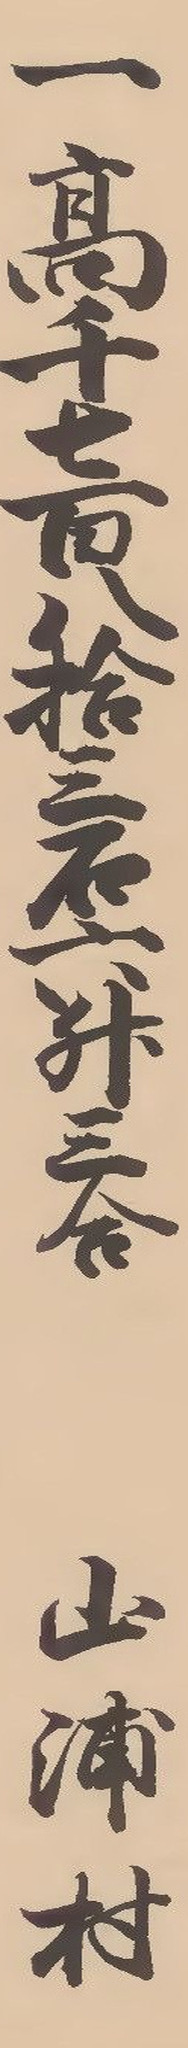一高千七百八拾三石六升三合山浦村
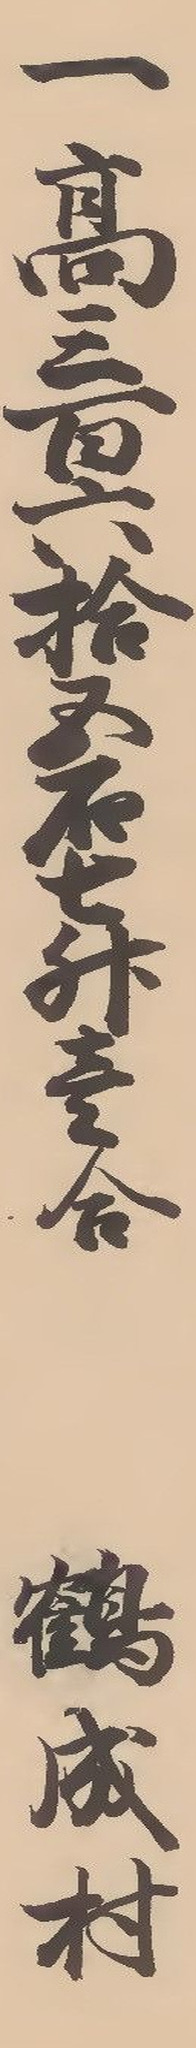一高三百六拾五石七升壱合鶴成村
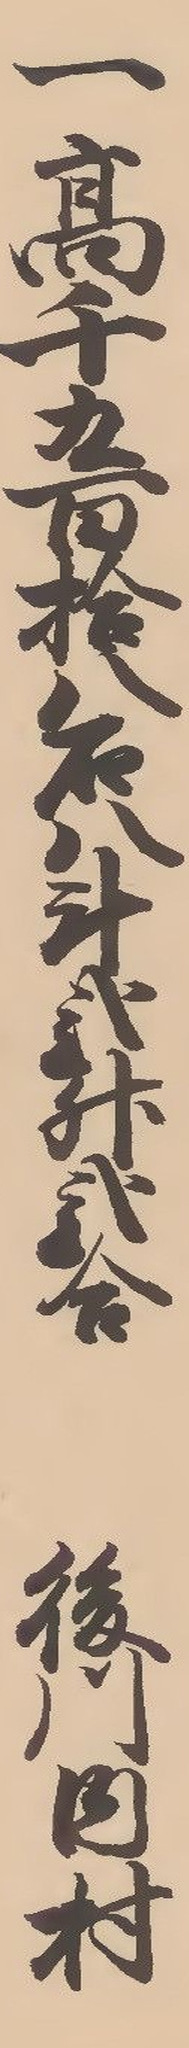一高千九百拾八石八斗弐升弐合後川内村
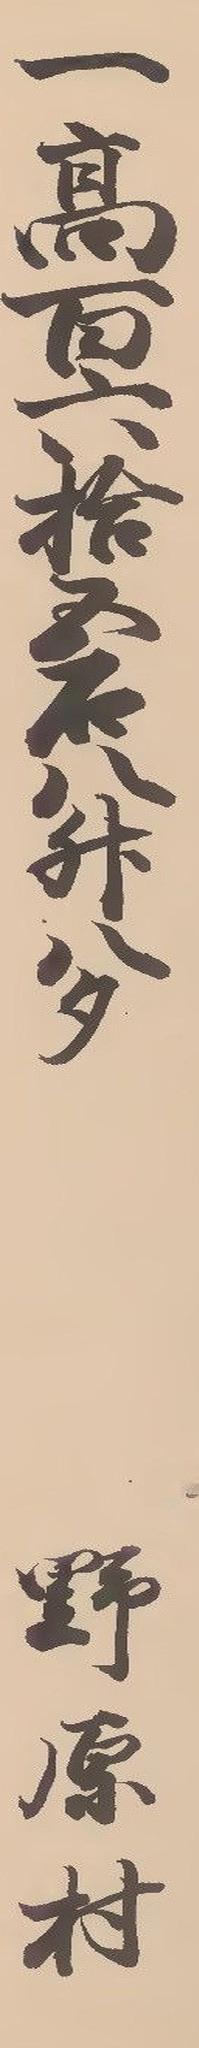一高百六拾五石八升八勺野原村
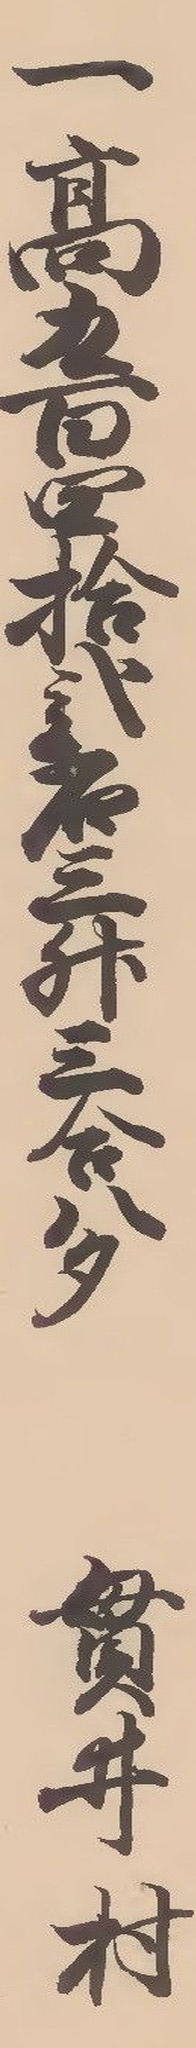一高九百四拾弐石三升三合八勺貫井村
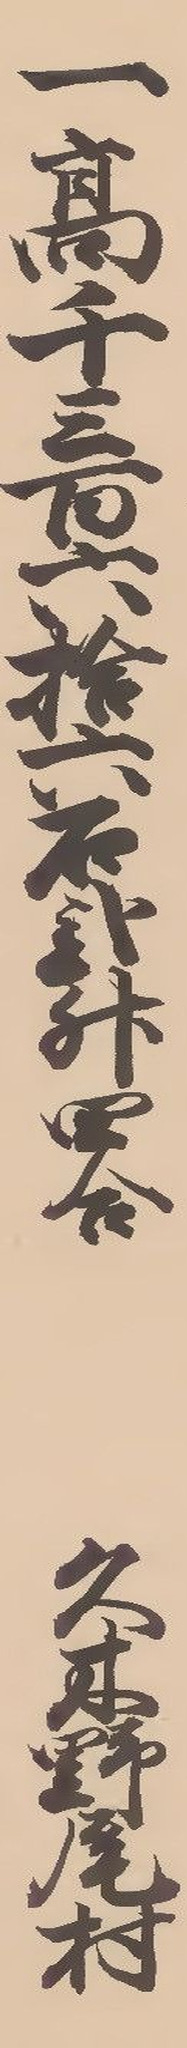一高千三百六拾六石弐升四合久木野尾村
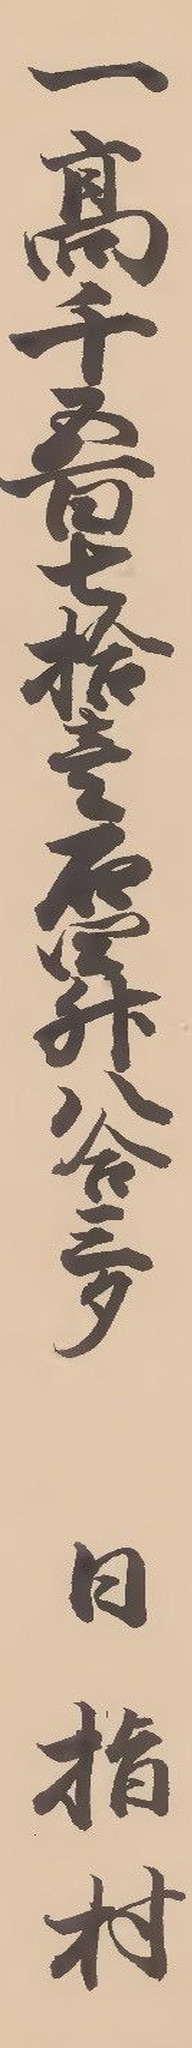一高千五百七拾壱石四升八合三勺日指村
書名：豊後国郷帳
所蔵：国立公文書館 National Archives of Japan
